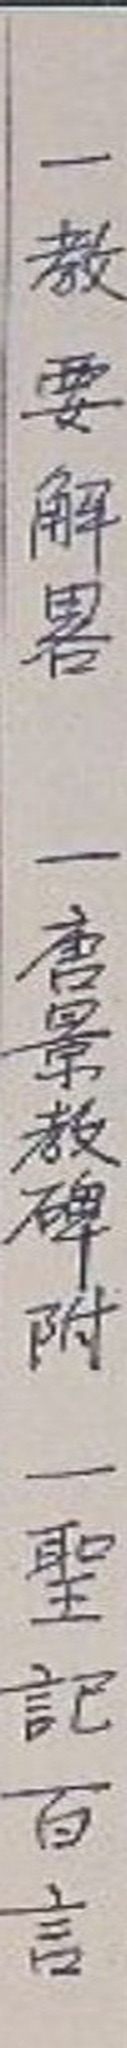一教要解略一唐景教碑附一聖記百言
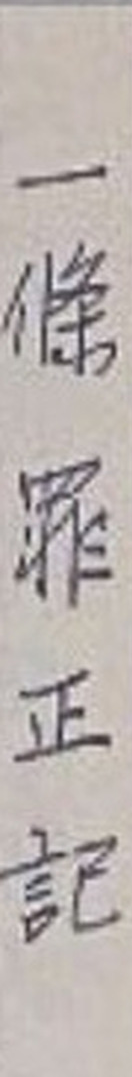一条罪正記
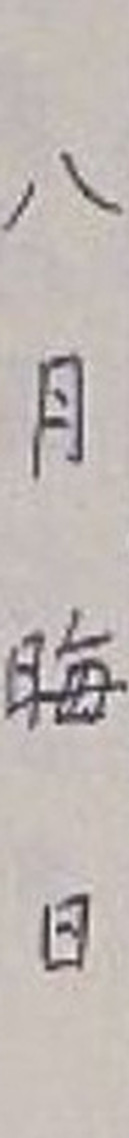八月晦日
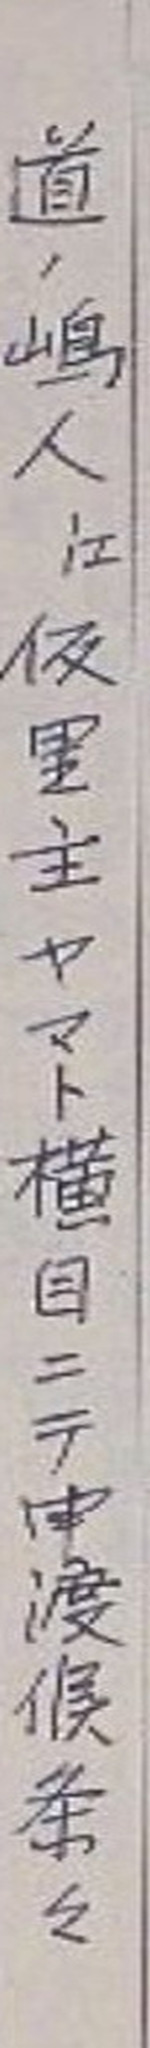道の島人え仮里主やまと横目にて申渡候条々
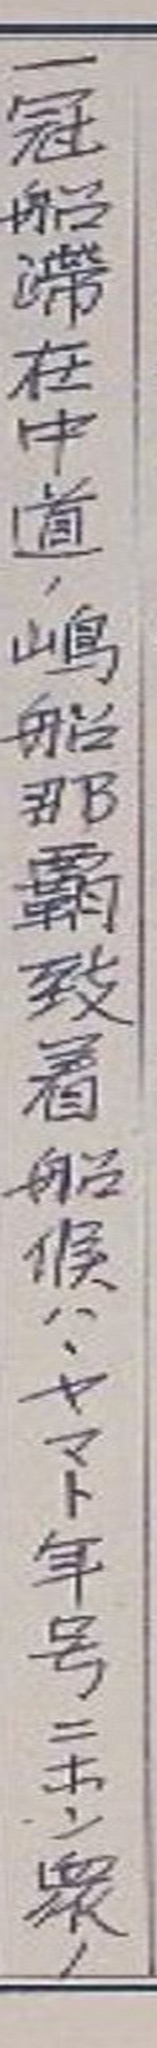一冠船滞在中道の島船那覇致着船候はゝやまと年号にほん衆の
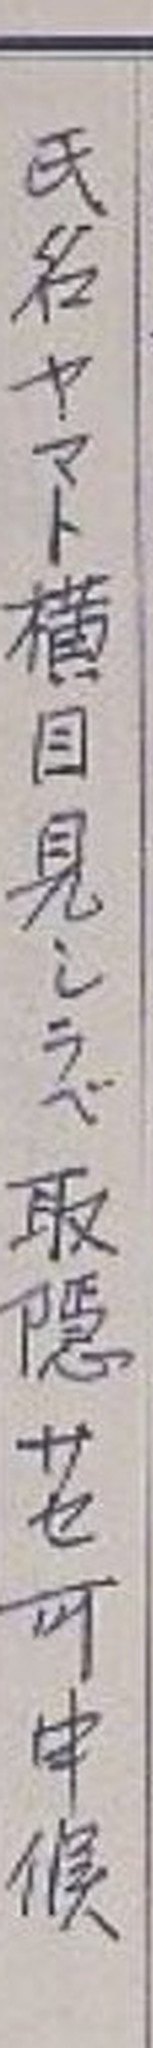氏名やまと横目見しらべ取隠させ可申候
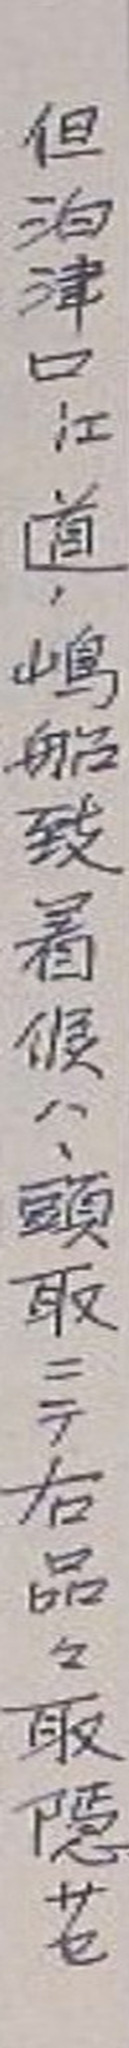但泊津口え道の島船致着候はゝ頭取にて右品々取隠させ
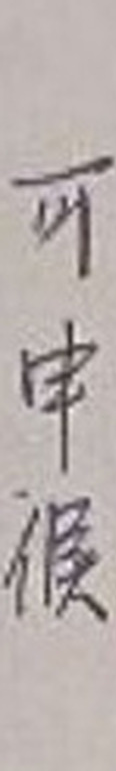可申候
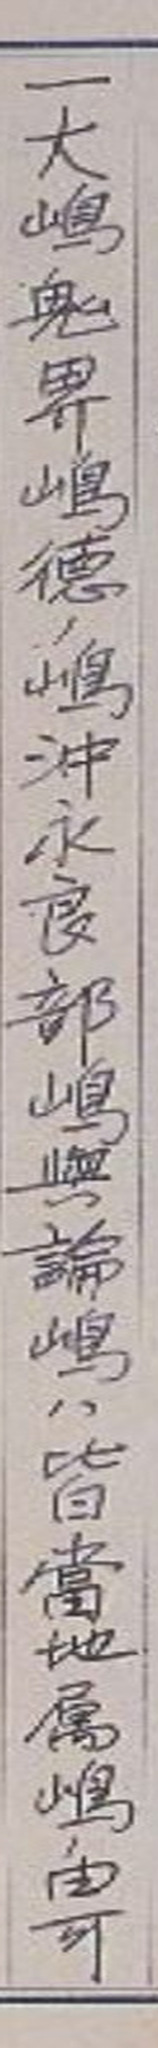一大島鬼界島徳ノ島沖永良部島与論島は皆当地属島の由可

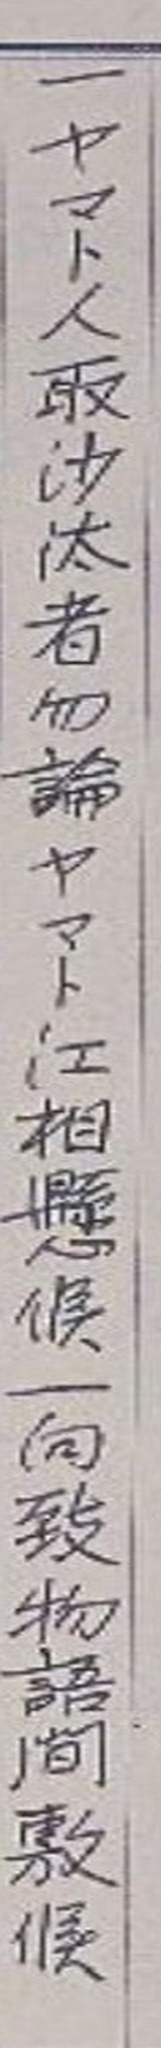一やまと人取沙汰者勿論やまとえ相懸候一向致物語間敷候
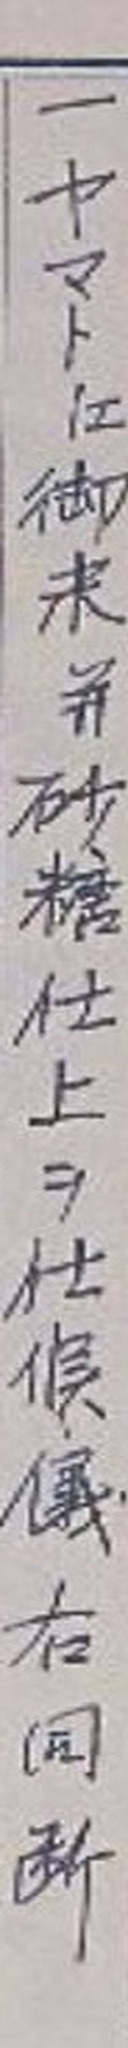一やまとえ御米并砂糖仕上を仕候儀右同断
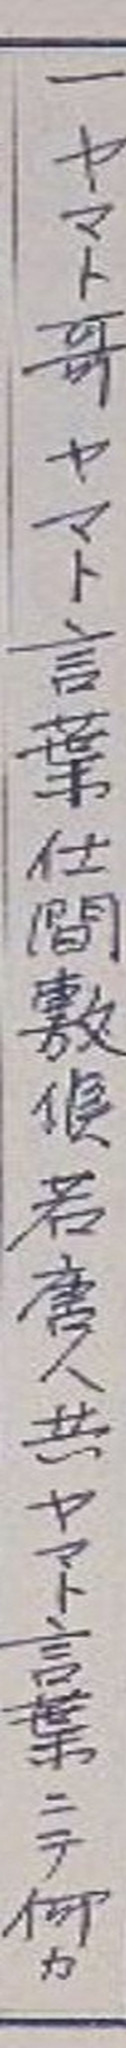一やまと哥やまと言葉仕間敷候若唐人共やまと言葉にて何か
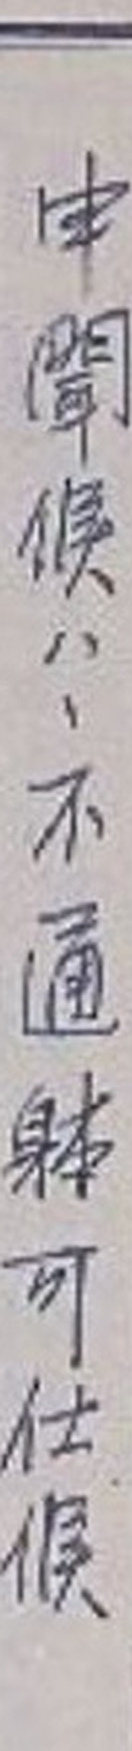申聞候はゝ不通躰可仕候
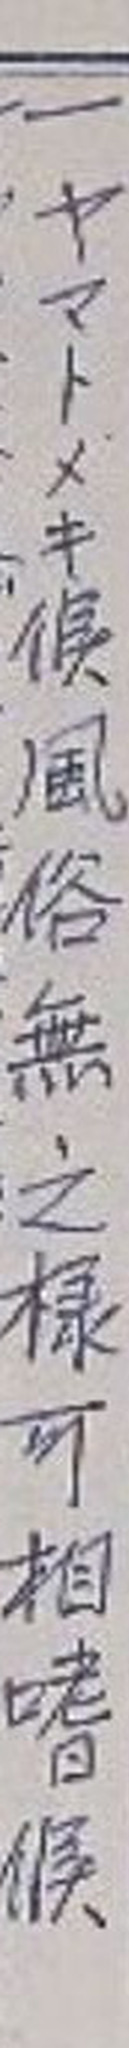一やまとめき候風俗無之様可相嗜候
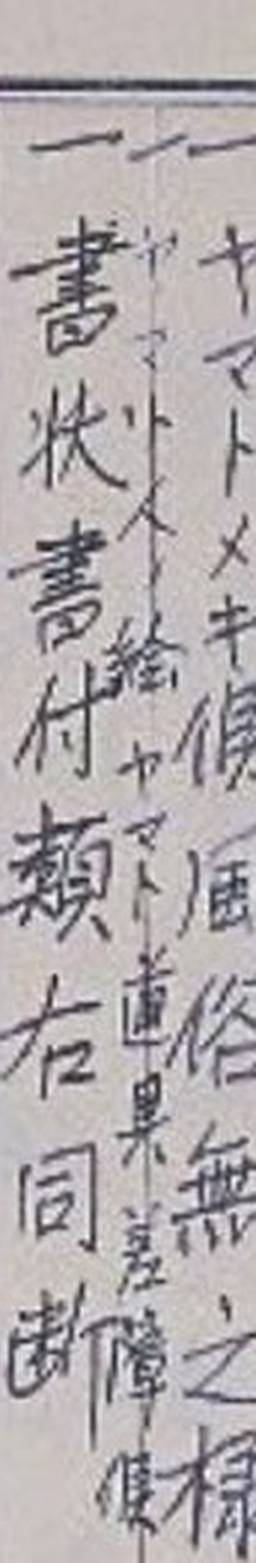一書状書付類右同断
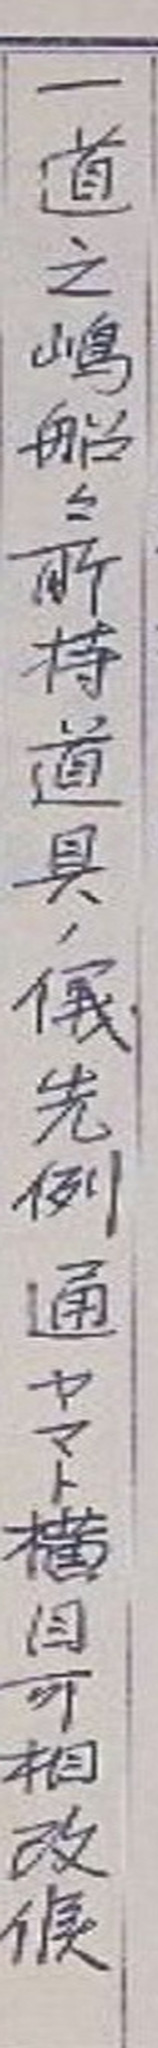一道の島船々所持道具の儀先例通やまと横目可相改候
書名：支那冊封使来琉諸記 下巻
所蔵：University of the Ryukyus Library
